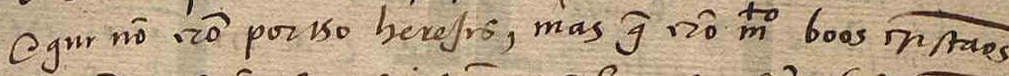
e que nō erō por iso hereJes, mas q̄ erō mto boos cristãos
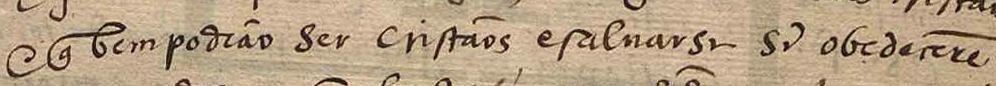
e q̄ bem podião ser cristãos e saluarse sē obedecēre
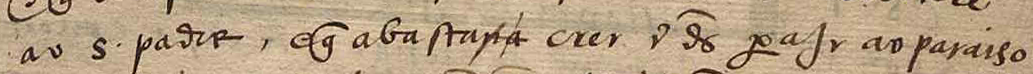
ao s. padre, e q̄ abastaua crer ē d̄s ꝑa Jr ao paraiso
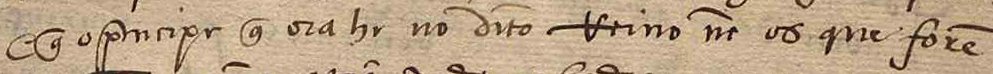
e q̄ o p̄incipe q̄ ora he no dito Reino n̄e os que forē
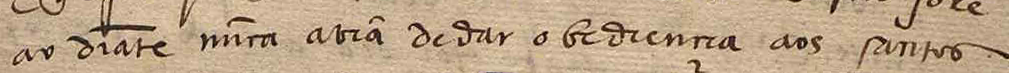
ao dīate nūca aviā de dar obediençia aos santos
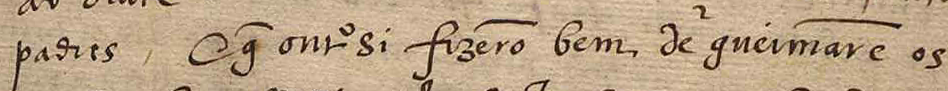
padres , e q̄ outosi fizēro bem de queimāre os
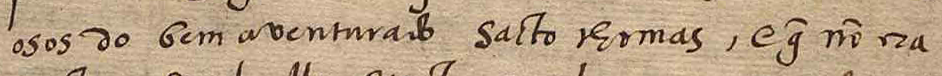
osos do bem aventurado Sacto thomas, e q̄ nō era
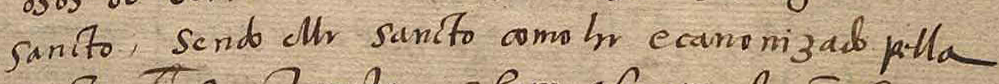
Sancto, sendo elle sancto como he e canonizado pella
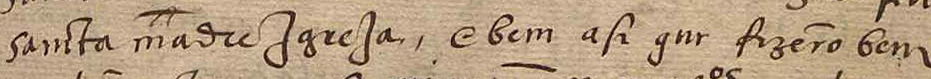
Sancta madre JgreJa, e bem asi que fizer̄o bem
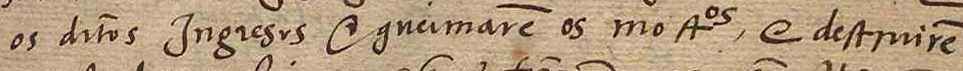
os ditos Jngreses ē queimar̄e os mostos, e destruirē
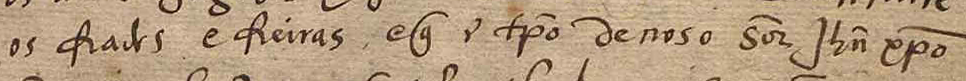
os frades e freiras , e q̄ ē tp̄o de noso Sōr Jhū xp̄o
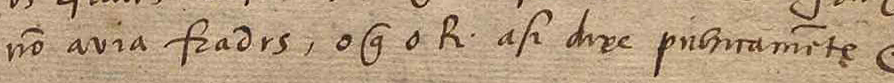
nō avia frades, o q̄ o R. asi dixe pubricamēte e
